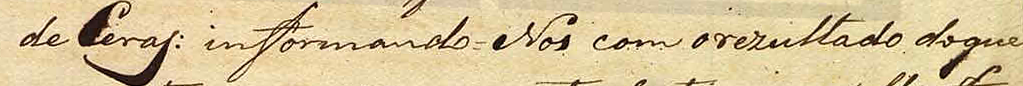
de Ceras: informando-Nos com o rezultado do que
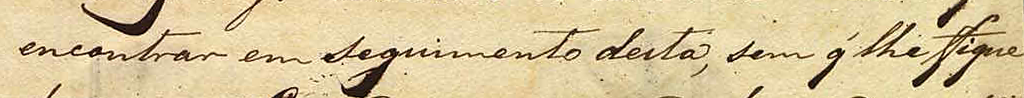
encontrar em seguimento desta, sem q̄ lhe fique
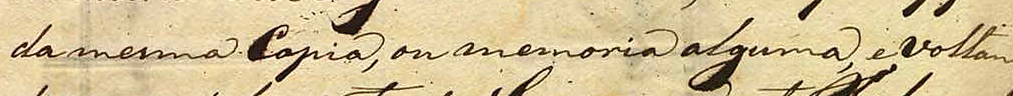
da mesma Copia, ou memoria alguma, e voltan
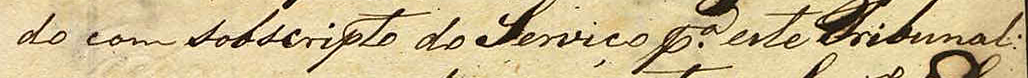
do com sobscripto do Serviço p.a este Tribunal:
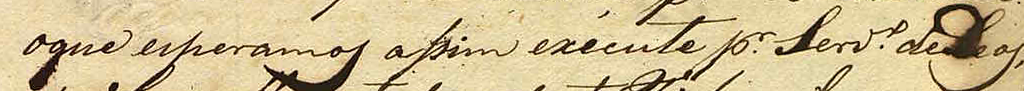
o que esperamos assim execute p.r Serv.o de Deos,
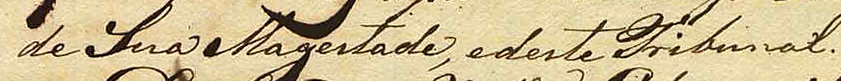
de Sua Magestade, e deste Tribunal.
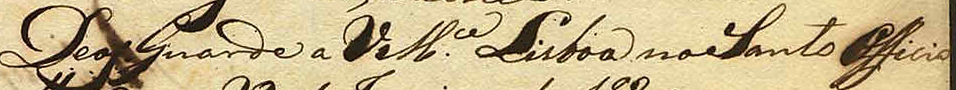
Deos Guarde a VM.ce Lisboa no Santo Officio
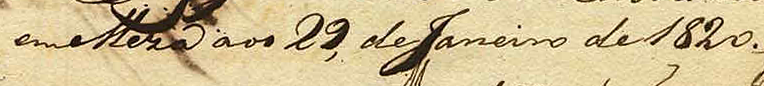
em Meza aos 29, de Janeiro de 1820.
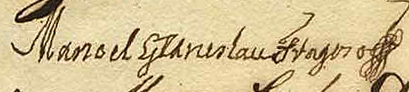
Manoel Estanislau Fragoso
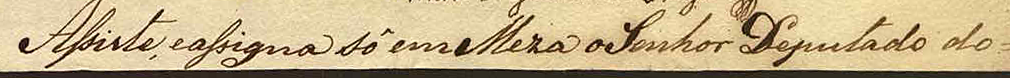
Assiste, e assigna só em Meza o Senhor Deputado do
